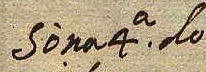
Sò na 4.a do
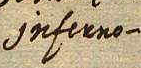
jnferno -
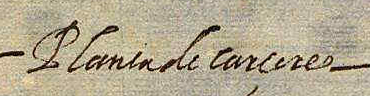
Planta de carcere –
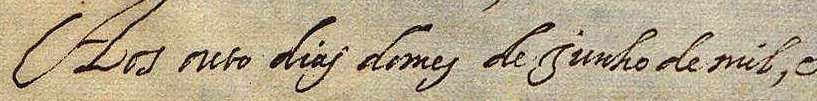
Aos outo dias do mes de Junho de mil, &
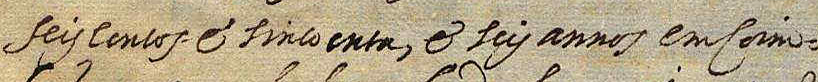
seiscentos & sincoenta, & seis annos em Coim
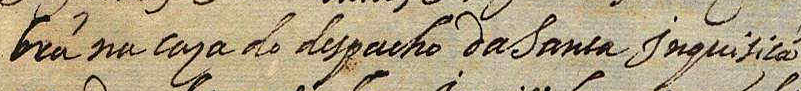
bra na caza do despacho da Santa Jnquisiçaõ
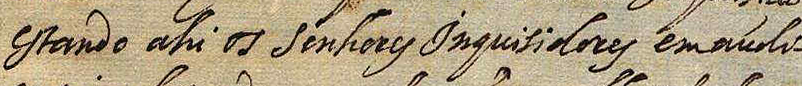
estando ahi os Senhores Inquisidores em audi
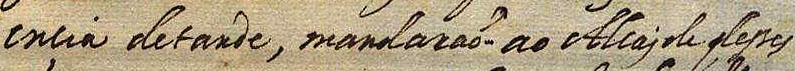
encia de tarde, mandarão ao Alcajde desses
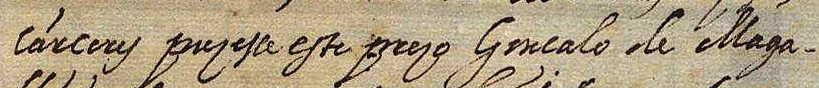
carceres puzesse este prezo Gonçalo de Maga
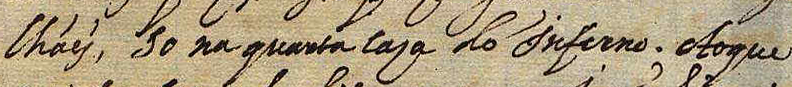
lhães, so na quarta caza do Inferno. Ao que
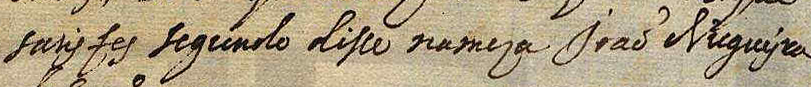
satisfes segundo disse na meza Joaõ Nuguejra
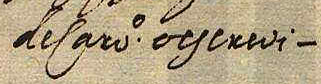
de Carv.o o escrevi -
